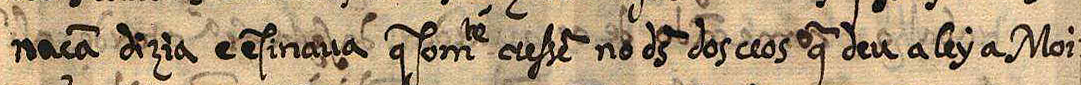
naçā dizia e ēsinaua q̄ somte cressē no ds̄ dos ceos q̄ deu a ley a Moi
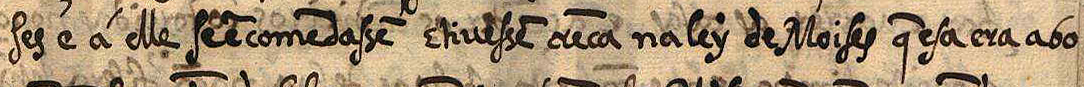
ses e a elle se ēcomēdassē E tiuessē crēça na ley de Moises q̄ esa era a bo
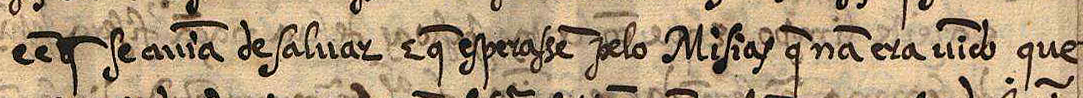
e ē q̄ se auiā de saluar E q̄ esperassē pelo Misias q̄ nā era uīdo que
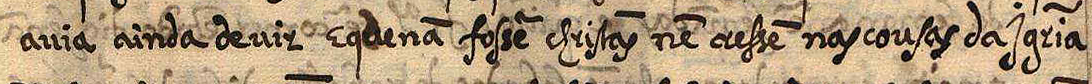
auia ainda de uir E que nā fossē christãs nē cressē nas cousas da Jgrīa
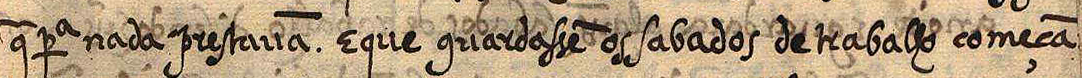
q̄ ꝑa nada prestauā. E que guardassē os sabados de trabalho começā
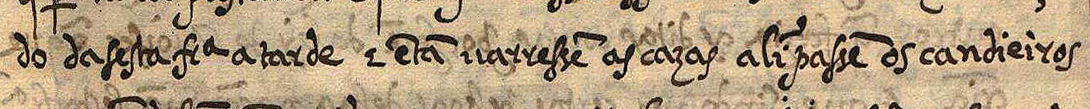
do da sesta fra a tarde E ētā uarressē as cazas alīpassē os candieiros
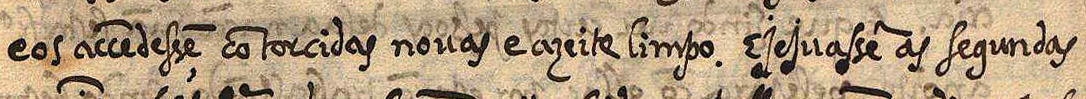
e os accēdessē cō torcidas nouas e azeite limpo. E JeJuassē as segundas
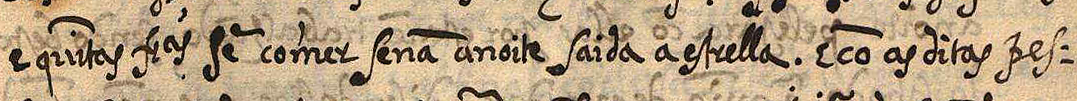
e quītas fras sē comer senā a noite saida a estrella. E cō as ditas pes
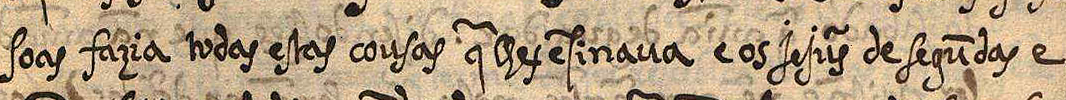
soas fazia todas estas cousas q̅ lhes ēsinaua e os JeJūs de segūdas e
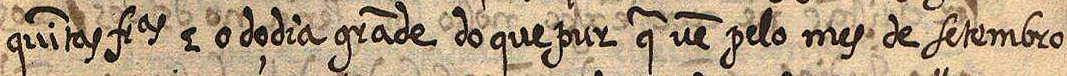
quītas fras E o do dia grāde do quepur q̄ uē pello mes de setembro
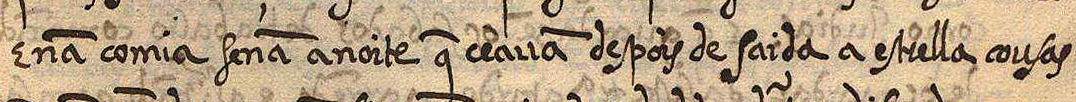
E nā comia senā a noite q̅ ceauā depois de saida a estrella cousas
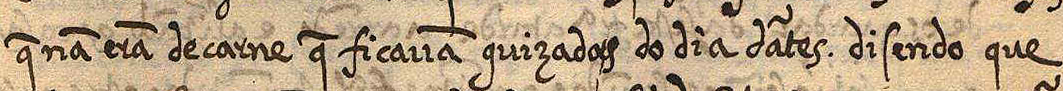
q̄ nā erā de carne q̄ ficauā guizadas do dia dātes. disendo que
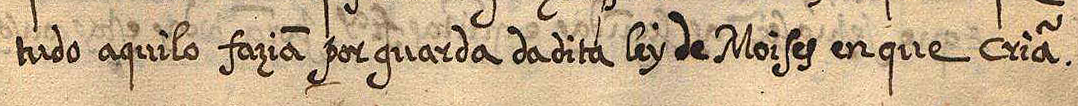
tudo aquilo faziā por guarda da dita ley de Moises en que criā
